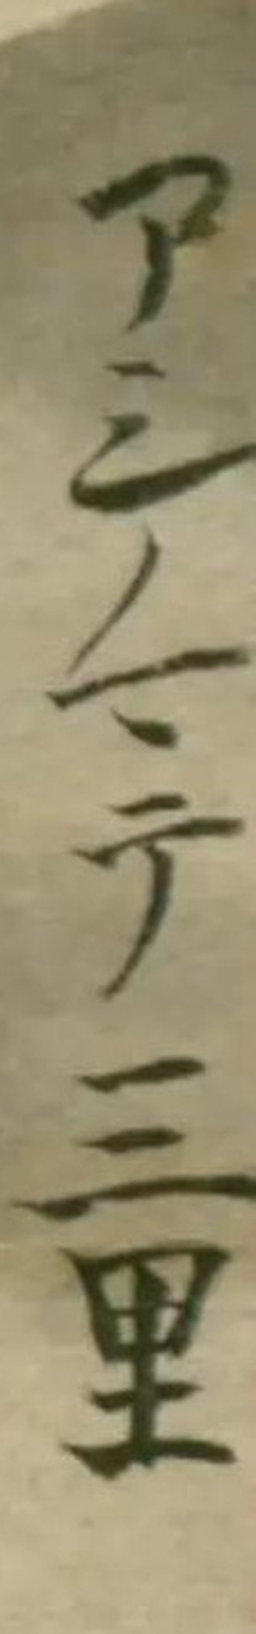アシノマテ三里
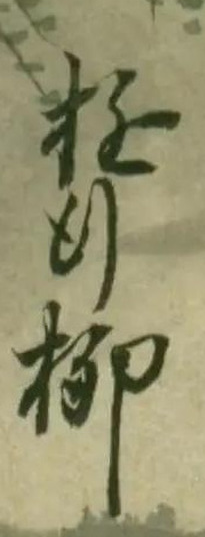遊行柳
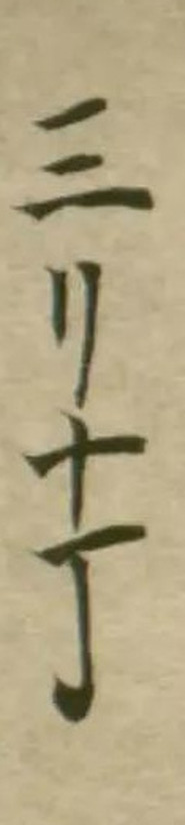三リ十丁

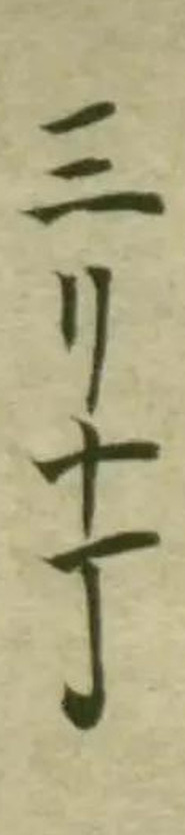三リ十丁
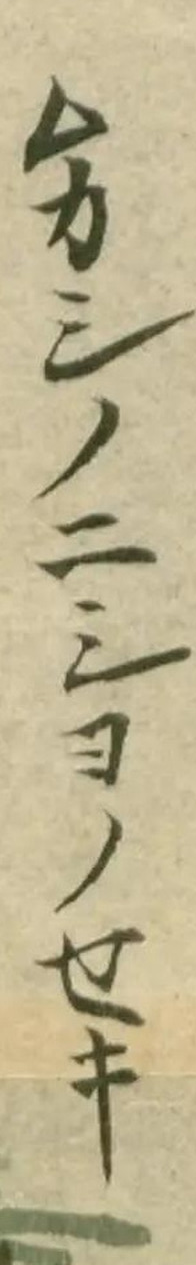ムカシノニシヨノセキ
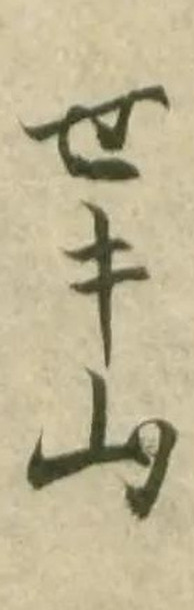セキ山
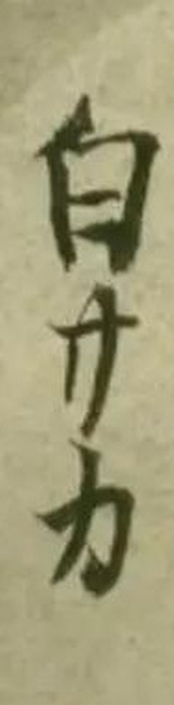白サカ
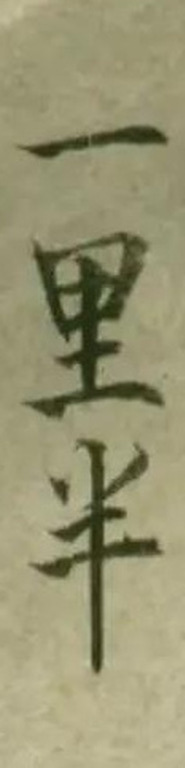一里半
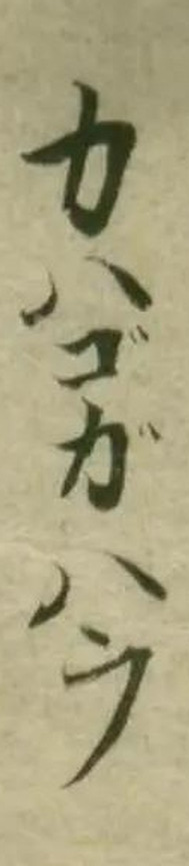カハゴガハラ
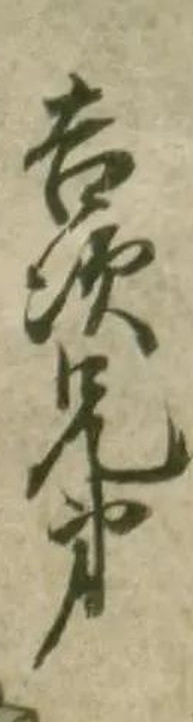吉次兄弟

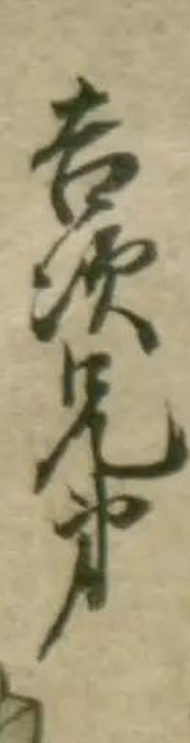吉次兄弟
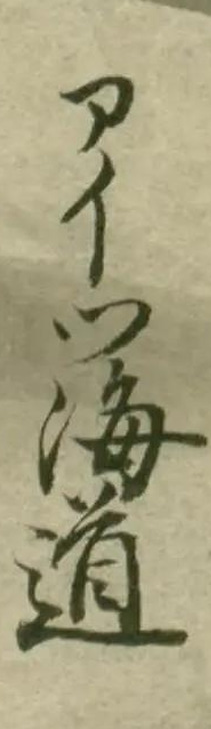アイツ海道
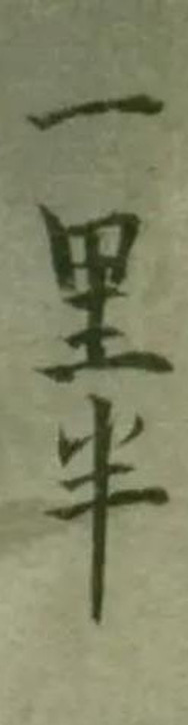一里半

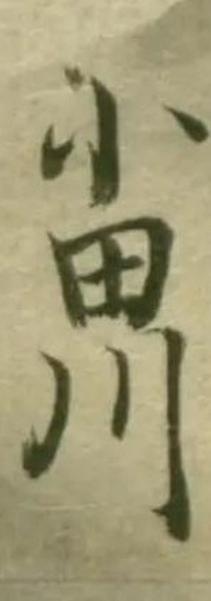小田川
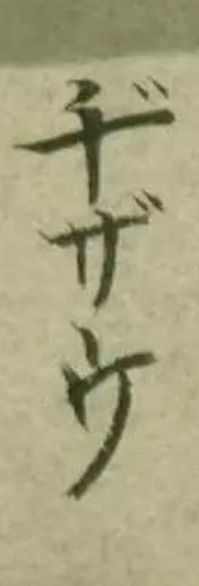ヂザウ
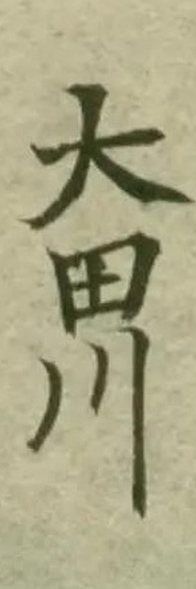大田川
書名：江戸より奥州津輕迄道筋之圖
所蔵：国立国会図書館 National Diet Library, JAPAN
